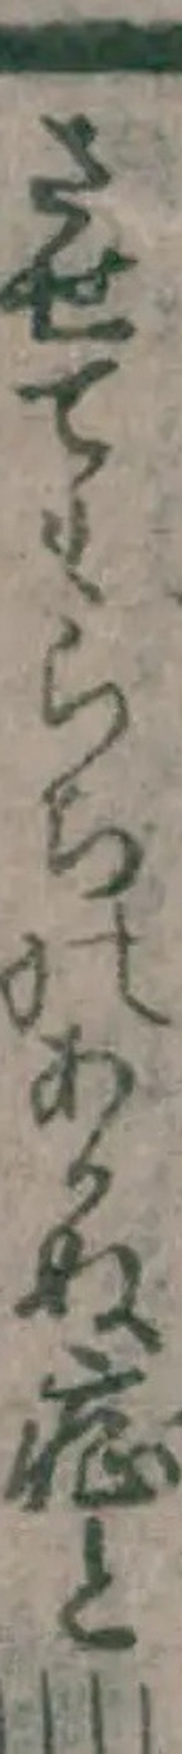させてもらちのあかぬ症と
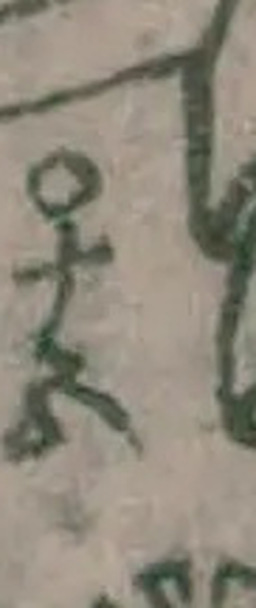〇十五
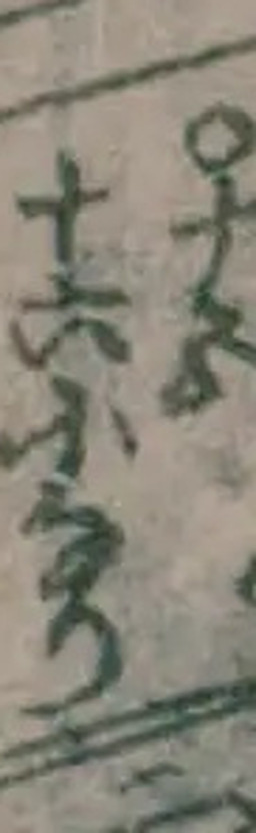十六になり
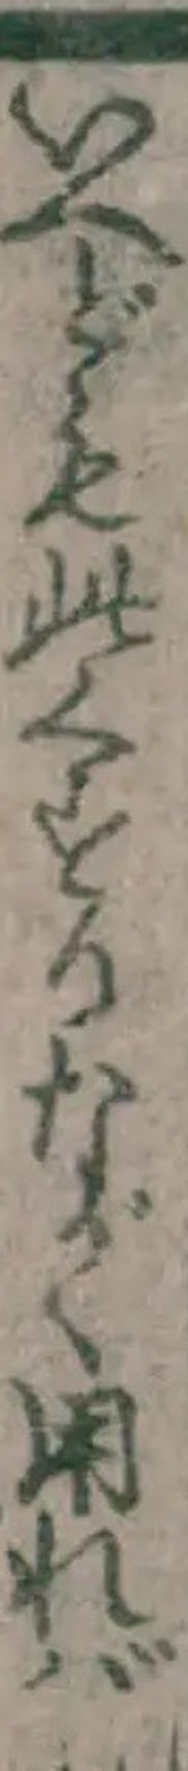いへども此くすりながく用れば
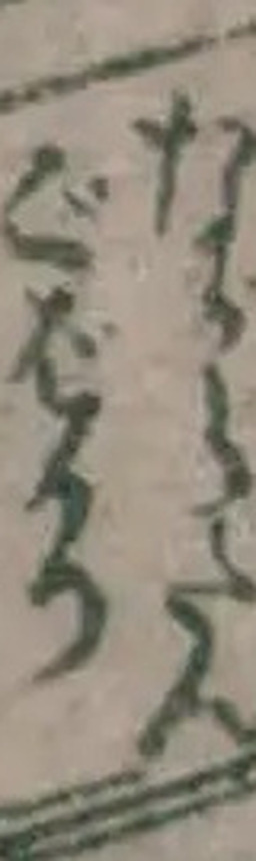ごばかり
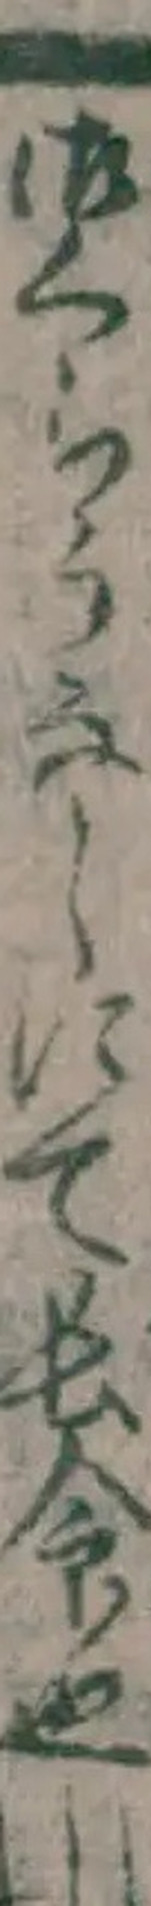御くらうなしにて長命也
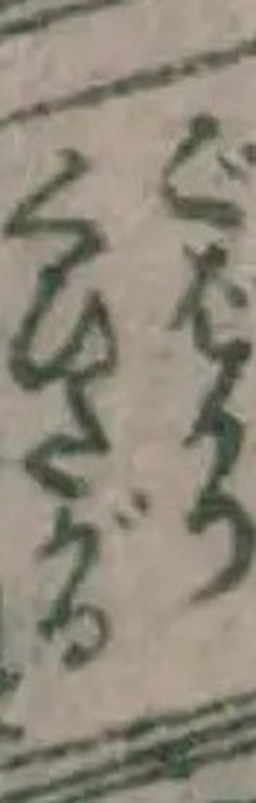くひたがると
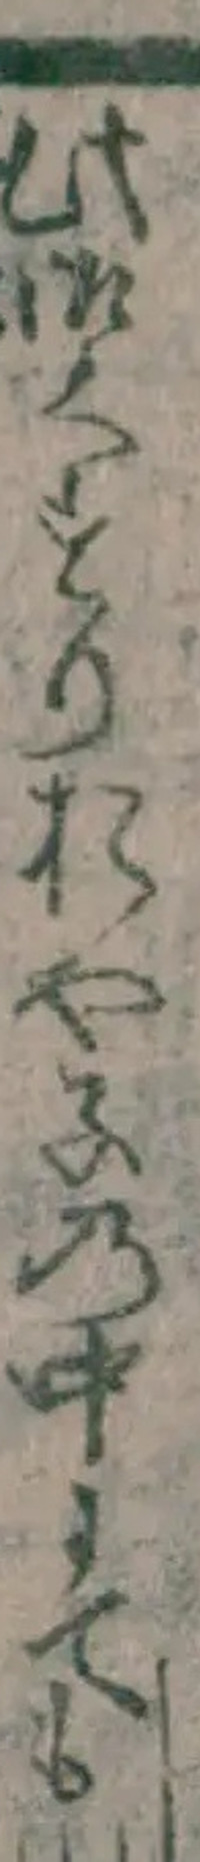此御くすりおや子の中にても
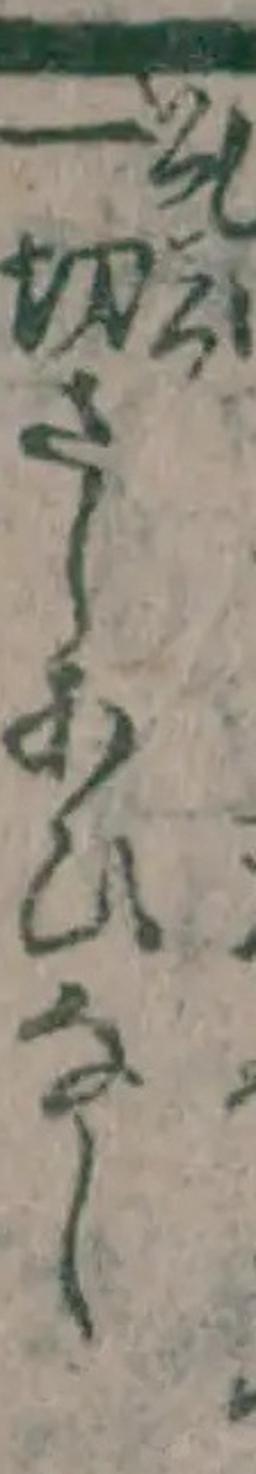一切さしあひなし
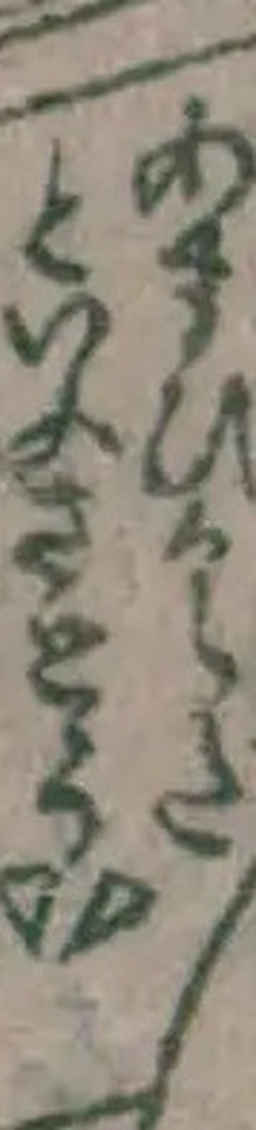といふさとう

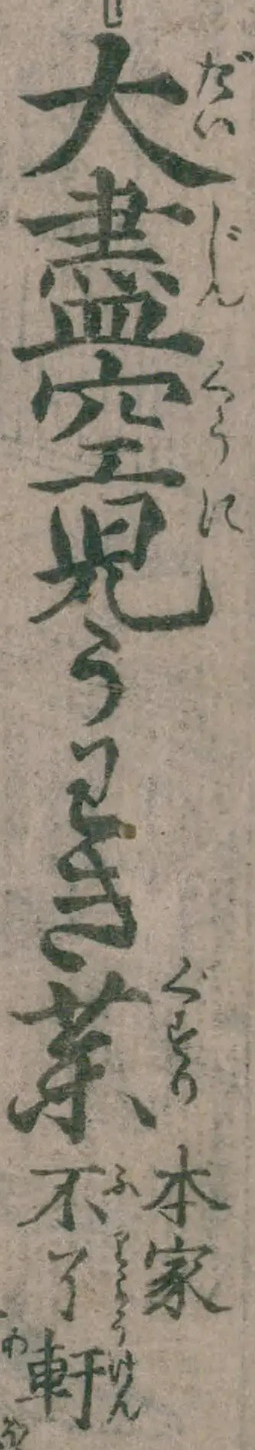大盡空児うわき薬不了軒
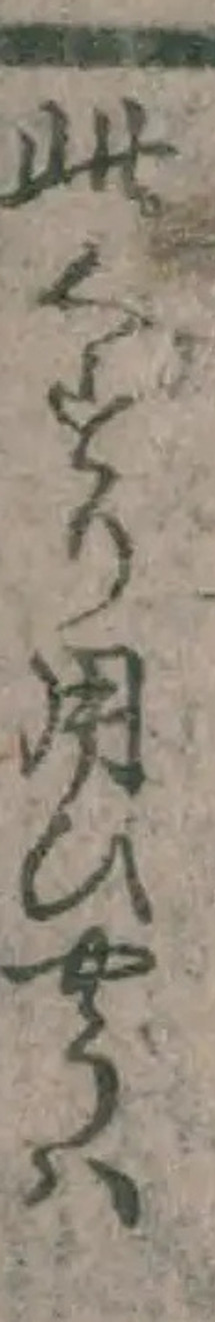此くすり用ひやうは
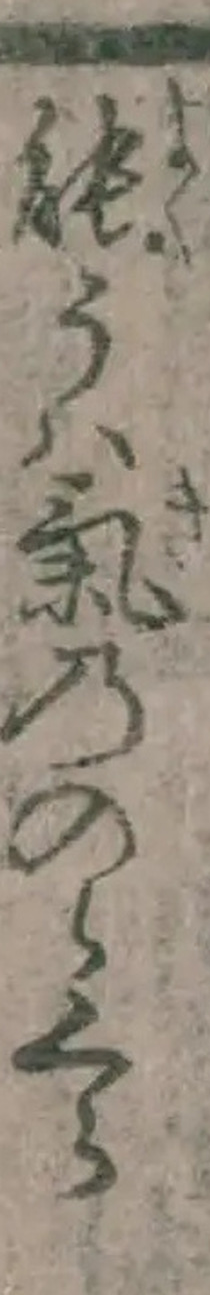能うは気ののらくら
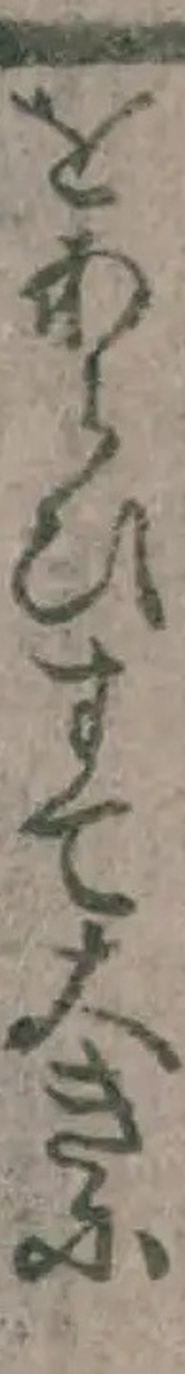をあらひすて大きに
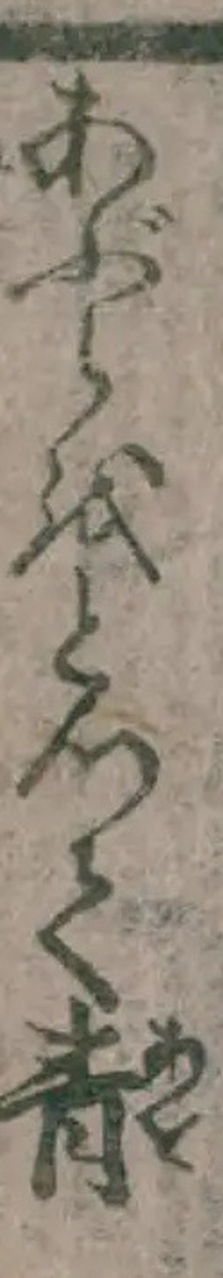あぶらをとつて青
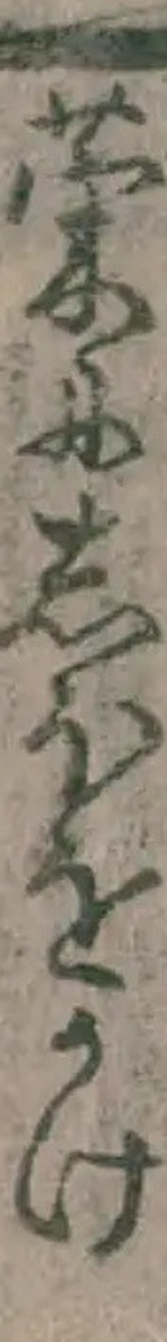菜にしほをかけ
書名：視薬霞報条 3巻
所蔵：国立国会図書館 National Diet Library, JAPAN
